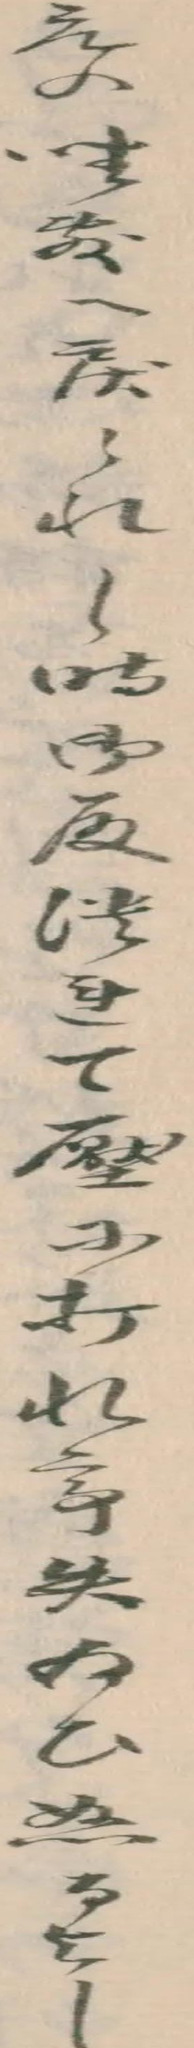元の坐敷へ戻られし時御殿潰れて圧に打れて失給ひぬるよし
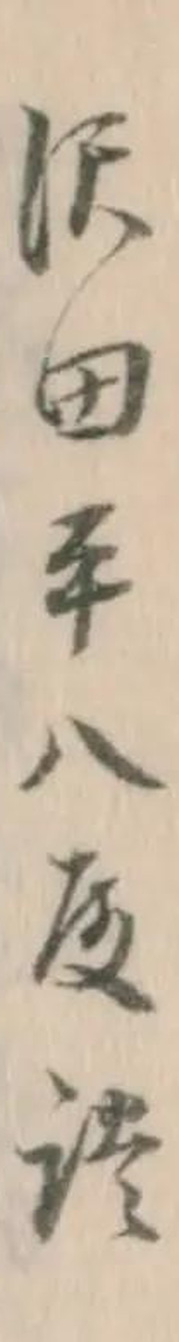沢田平八殿談
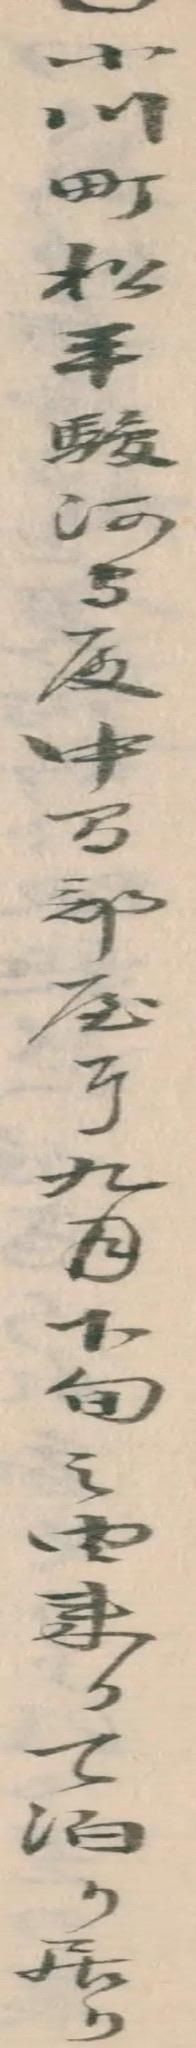〇小川町松平駿河守殿中間部屋に九月下旬之由来りて泊り居り
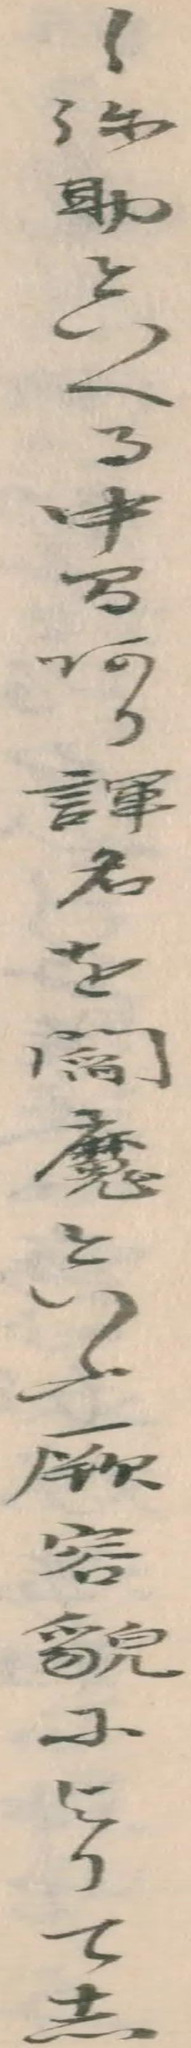し弥助といへる中間あり諢名を閻魔といふ厥容貌によりてし
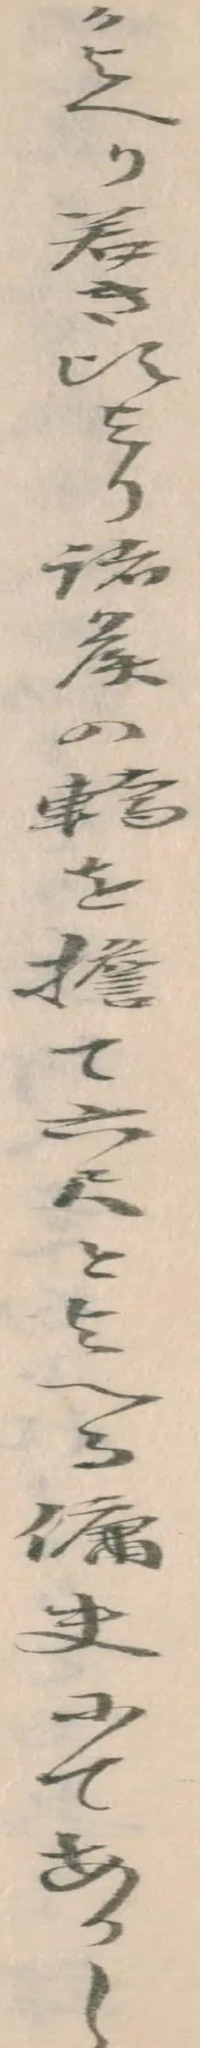かよへり若き頃より諸侯の轎を担て六尺とよへる傭夫にてありし
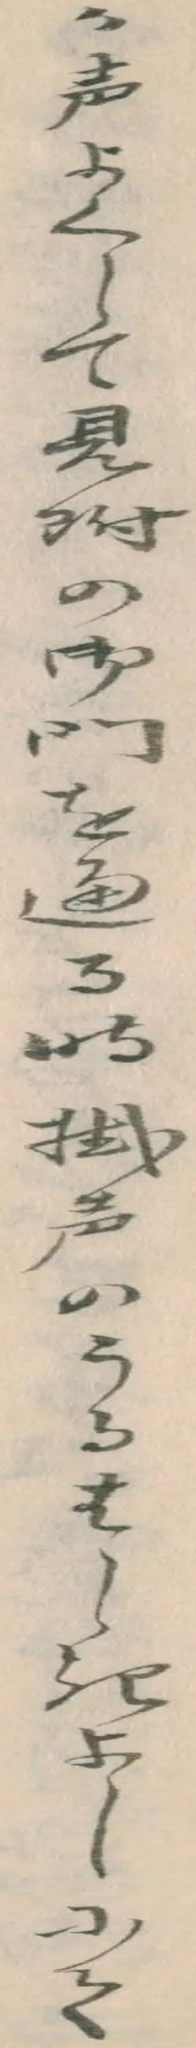か声よくして見附の御門を通る時掛声のうるはしきよしにて
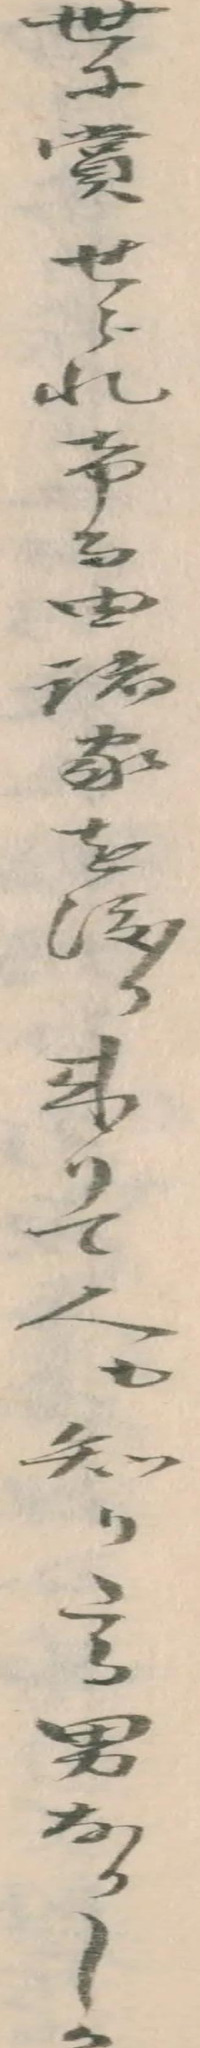世に賞せられける由諸家を渡り来りて人も知りたる男なりしか
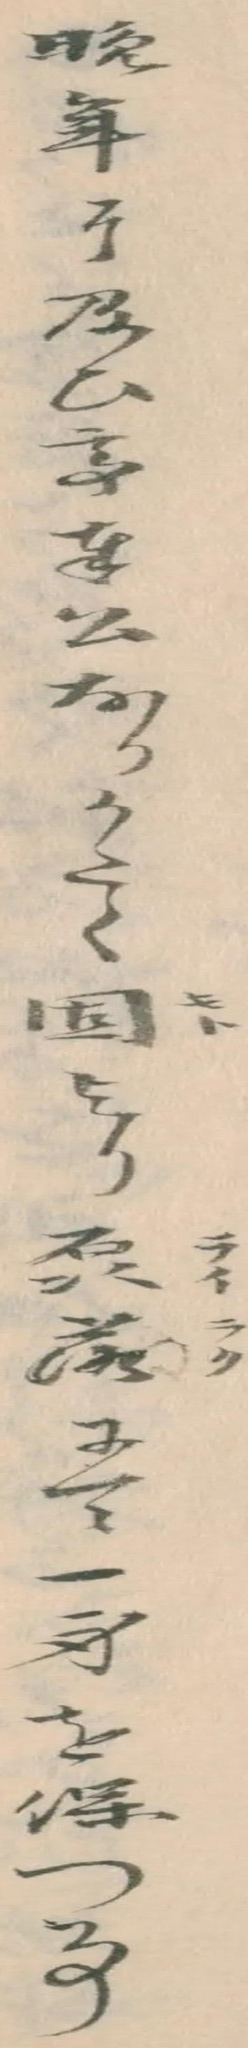晩年に及ひて奉公なりかたく固より磊落にて一身を保つ事

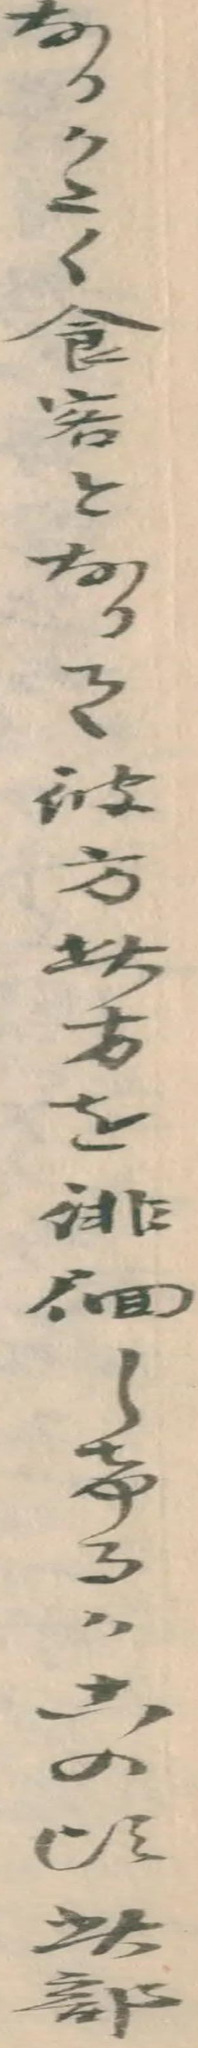なりかたく食客となりて彼方此方を徘徊しけるかこの頃此部
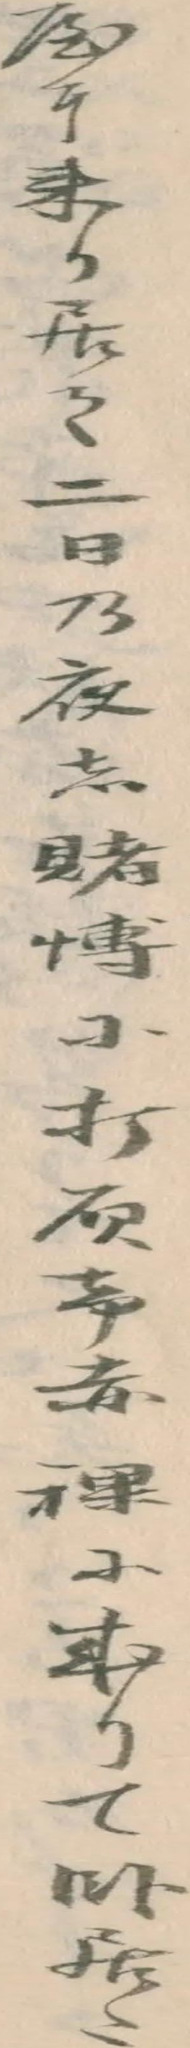屋に来り居て二日の夜は賭博に打負け赤裸に成りて臥居た
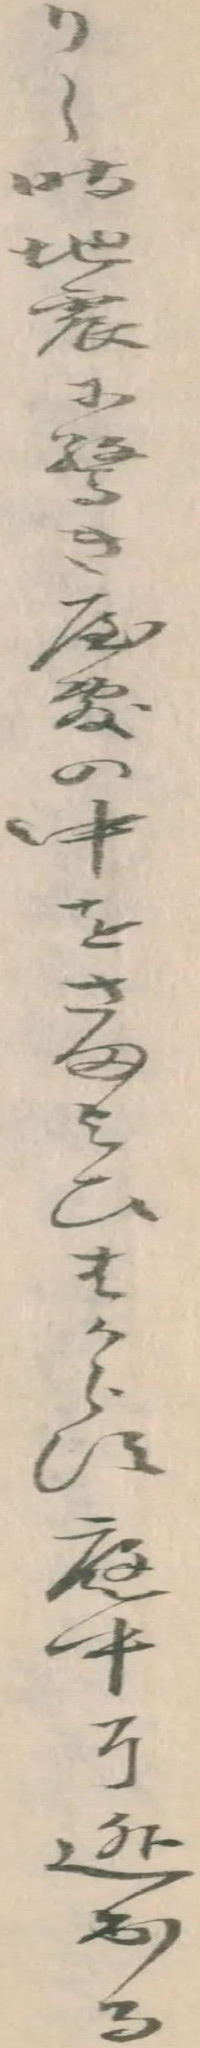りし時地震に驚き屋敷の中をさまよひはからす庭中に逃出る
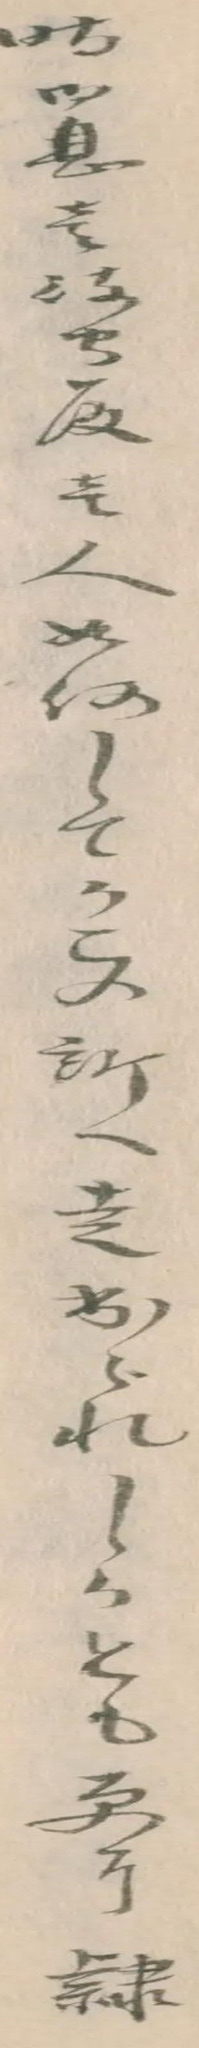時御息壱岐守殿壱人如何してかこの所へ走出られしかとも更に隷
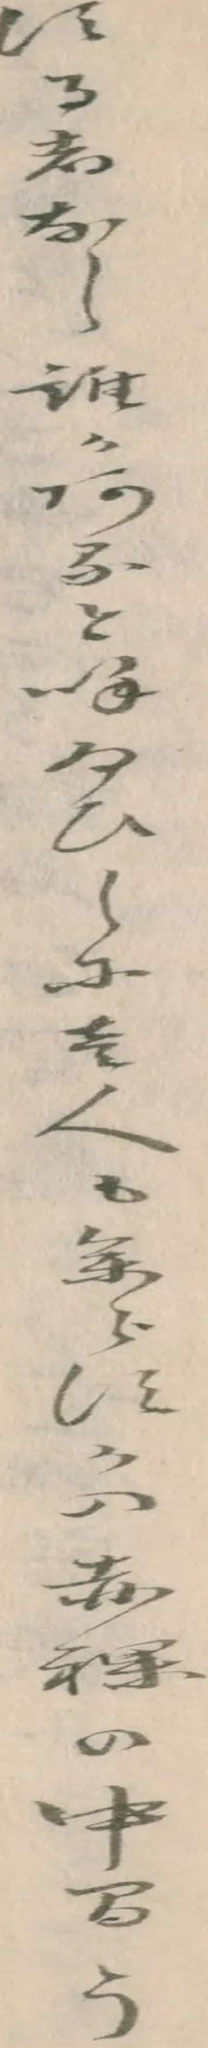する者なし誰かあると呼給ひしに壱人も参らすかの赤裸の中間う
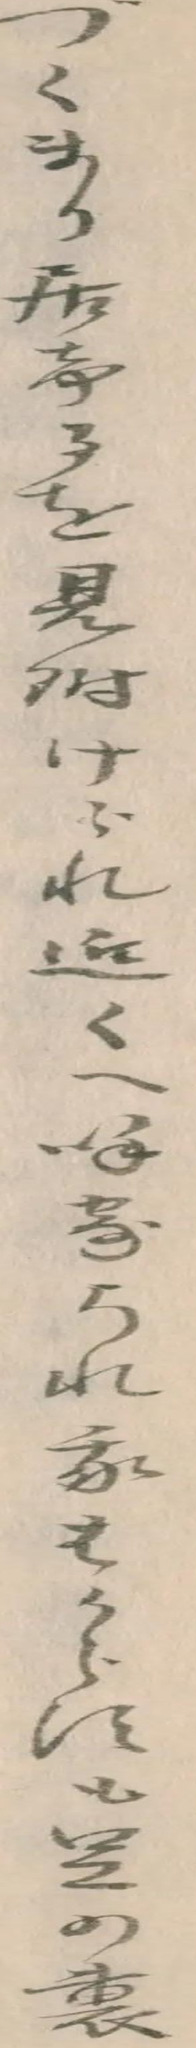づくまり居けるを見附けられ近くへ呼寄られ我はからすも足の裏
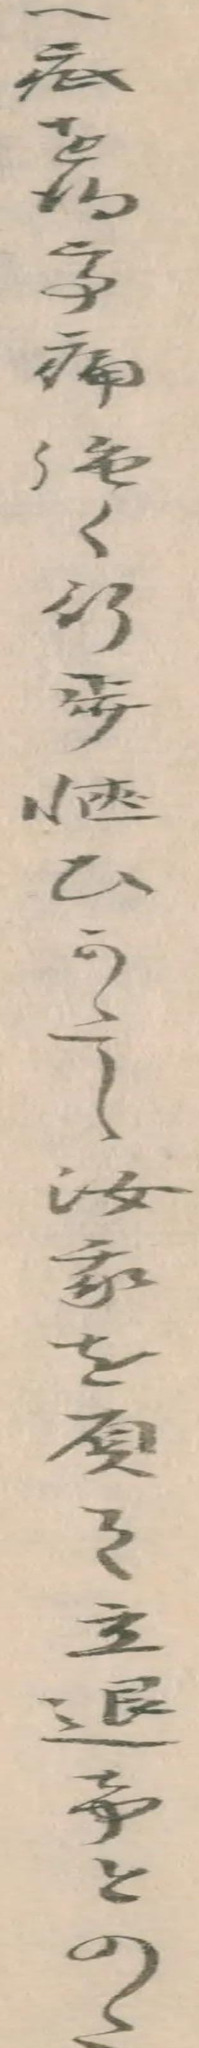へ疵を得て痛強く行歩愜ひかたし汝我を負て立退けとのた
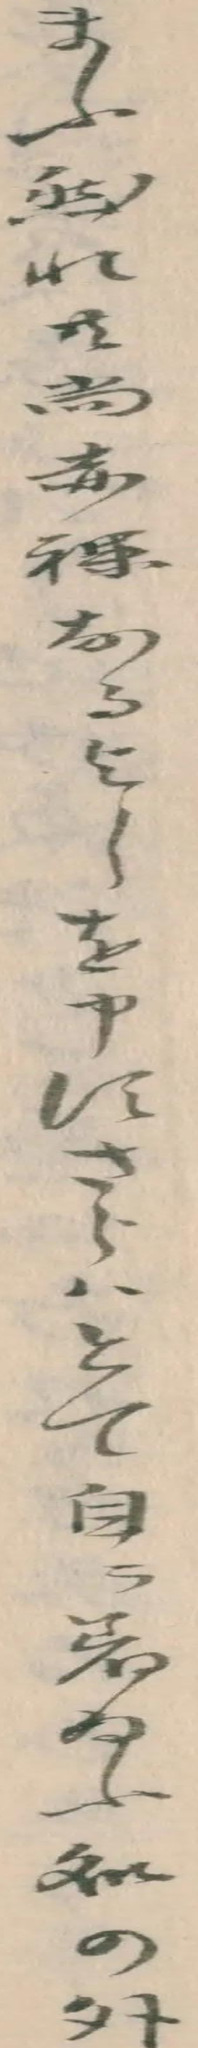まふ然れ共尚赤裸なるよしを申すさらはとて自着給ふ処の外
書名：地災撮要. 巻10(地震之部) 上,下
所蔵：国立国会図書館 National Diet Library, JAPAN
